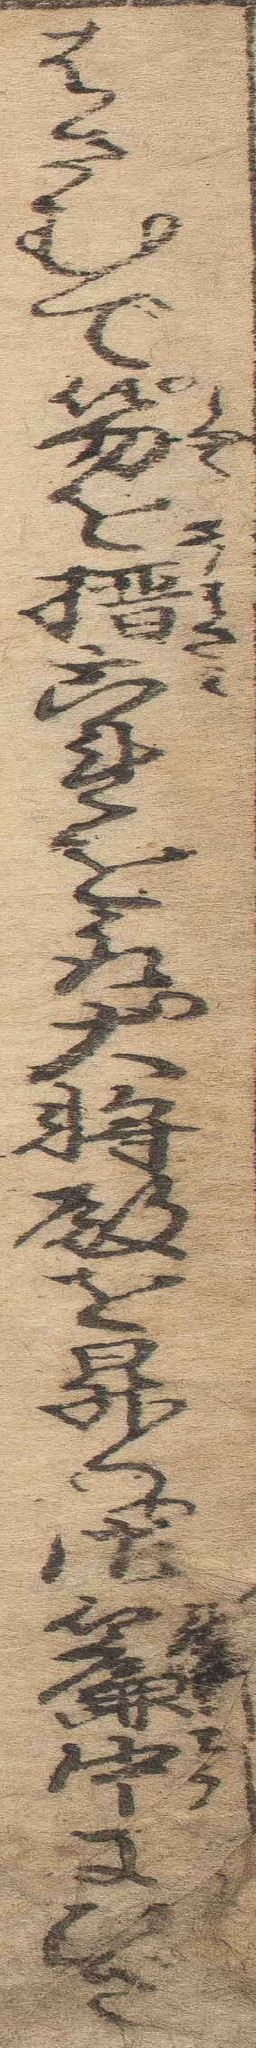はさむで。笏を搢これを取。大将殿を昇り。御簾中にひざ
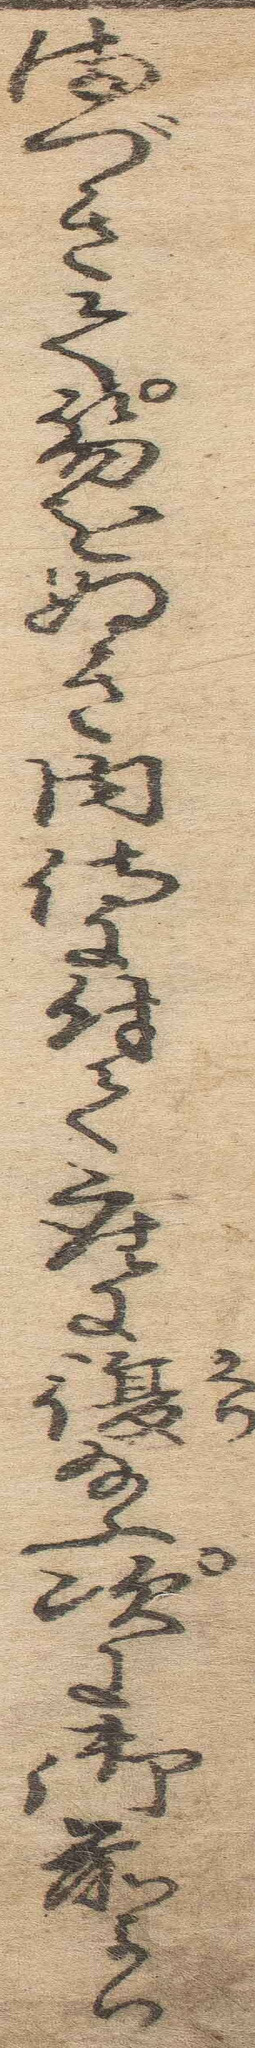まづきて。笏をぬき内侍に付て座に復給ふ。次に御前より
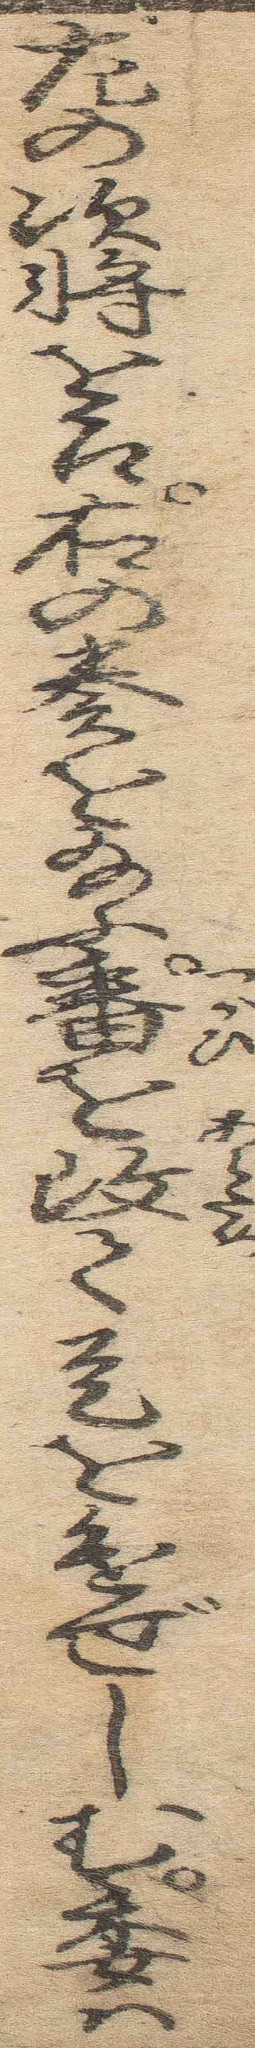左の次将を召。右の奏を給ふ。番を改て是を進ぜしむ。委は
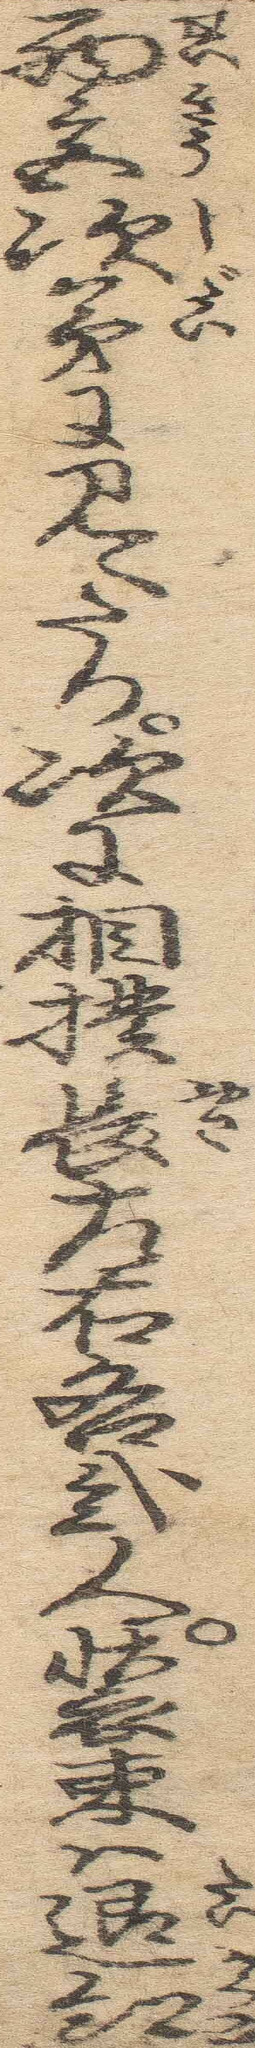西宮次第に見へたり。次に相撲長左右各弐人。装束は退紅
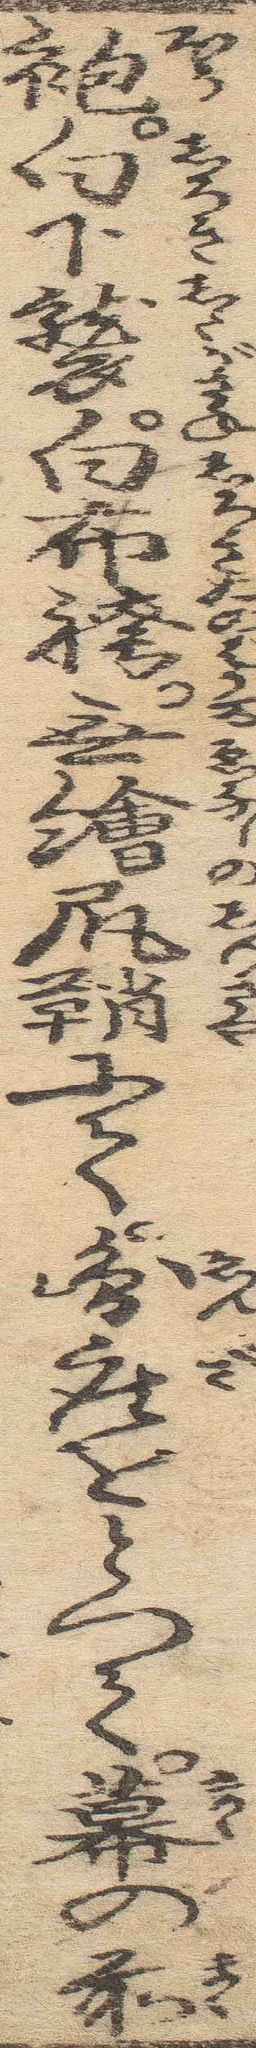袍。白下襲。白布袴。無絵尻鞘にて。円座をとつて。幕の前
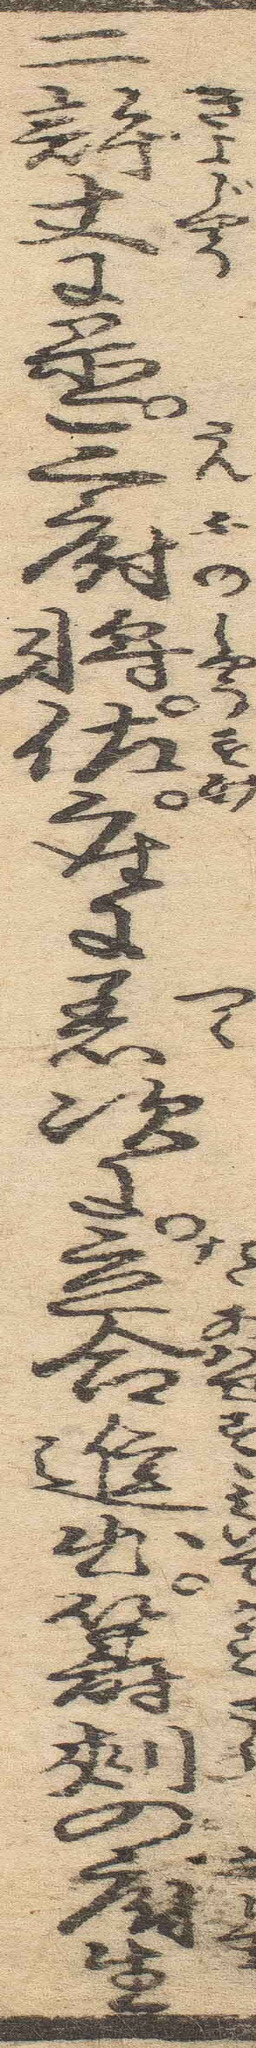二許丈に置。三府将。佐。座に着次に。立合進出。籌刺の府生
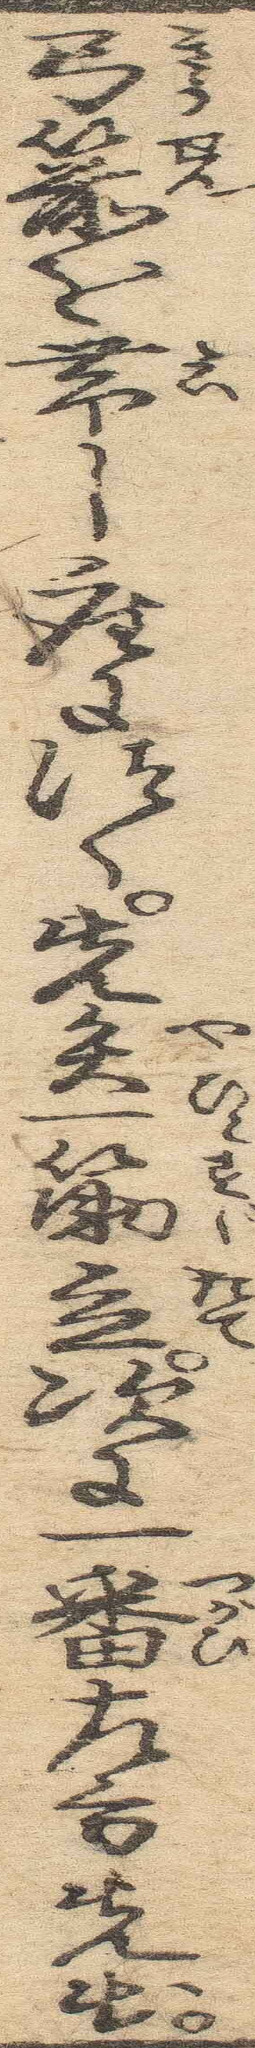弓箭を帯し座につく。先矢一筋立。次に一番左方先出。
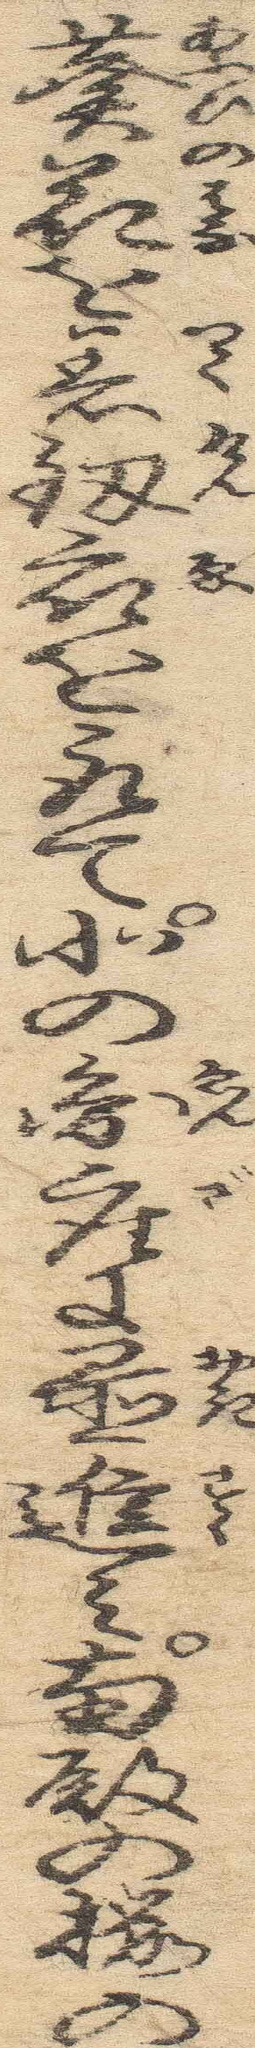葵花を着剱衣を取て。北の円座に置進。南殿の桜の
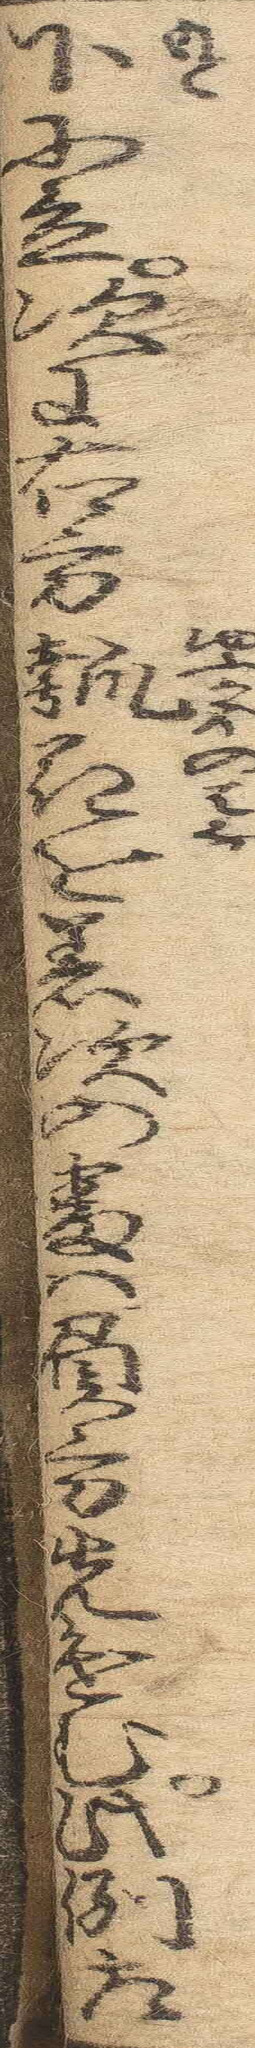下に立。次に右方瓠花を着次の番は負方先進む。此例左
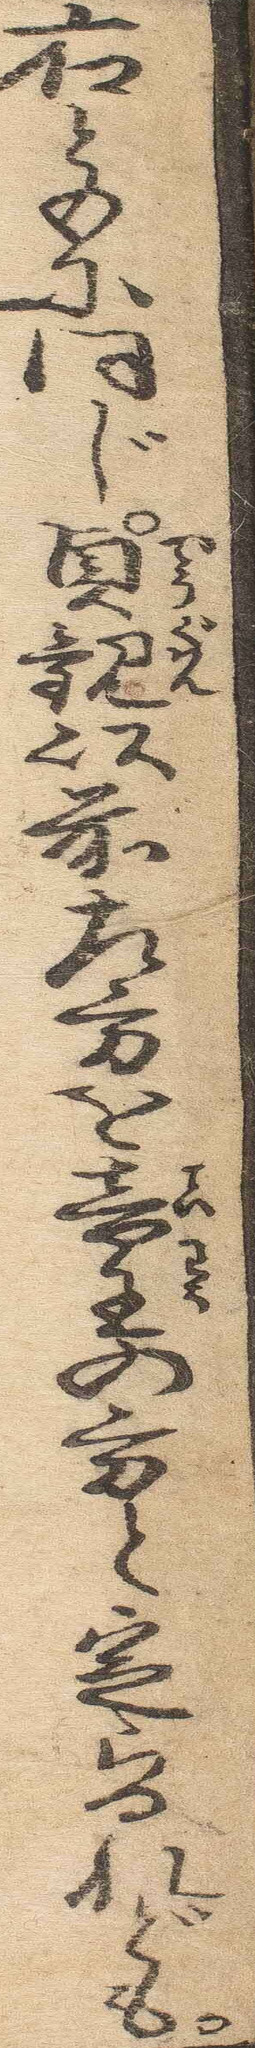右ともに同じ。貞観以前左方を帝王の方と定らるれども。
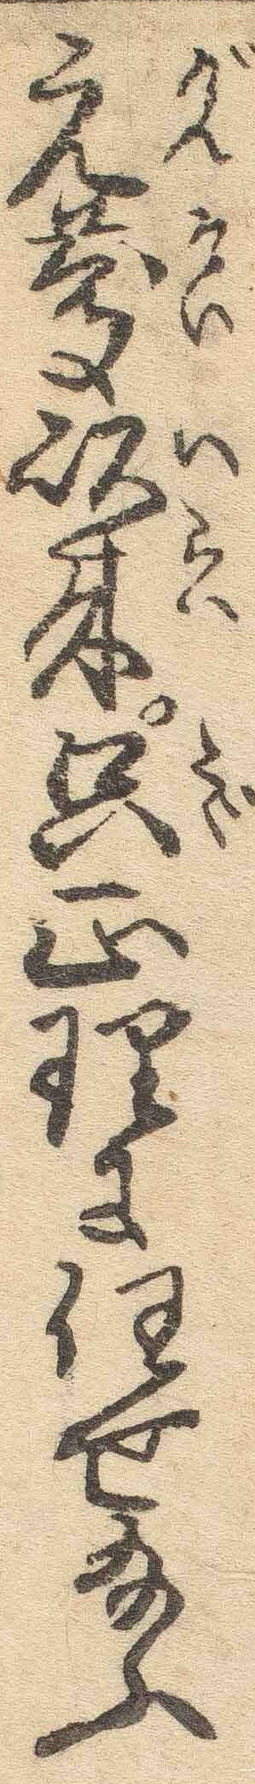元慶以来。只正理に任せ給ふ
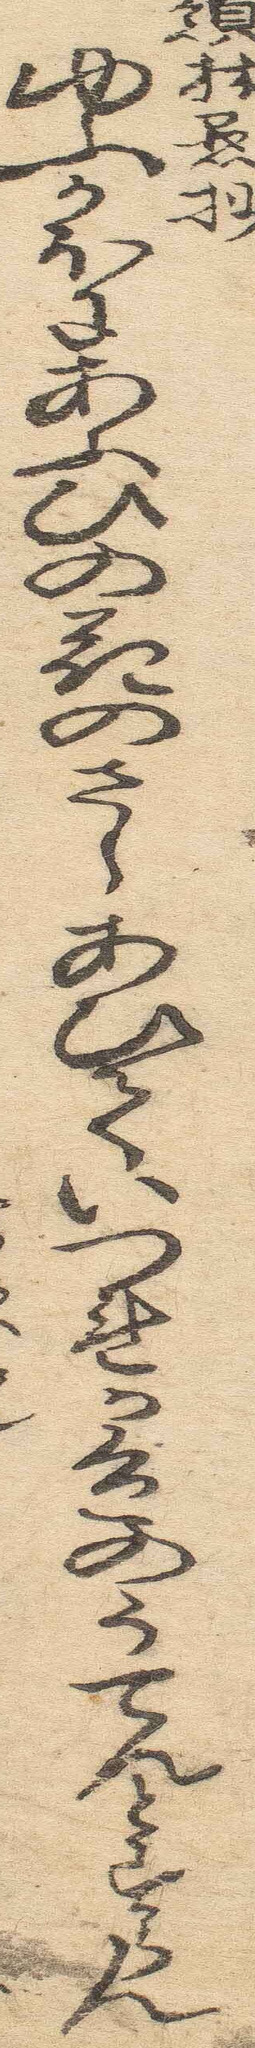ゆふかほにあふひの花のさしあひていつれか色のかてんとすらん
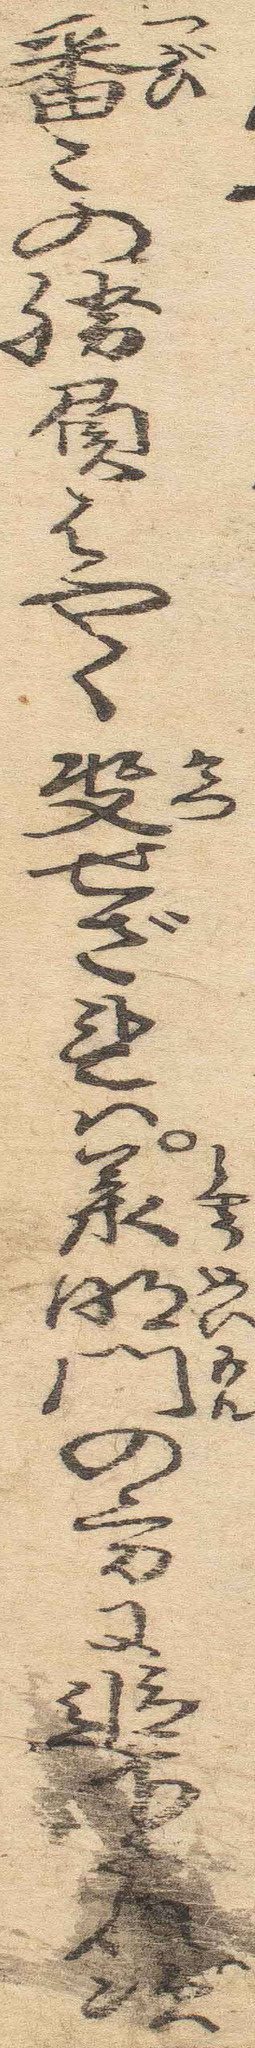番この勝負はやく決せざれば。承明門の方に追下され。次
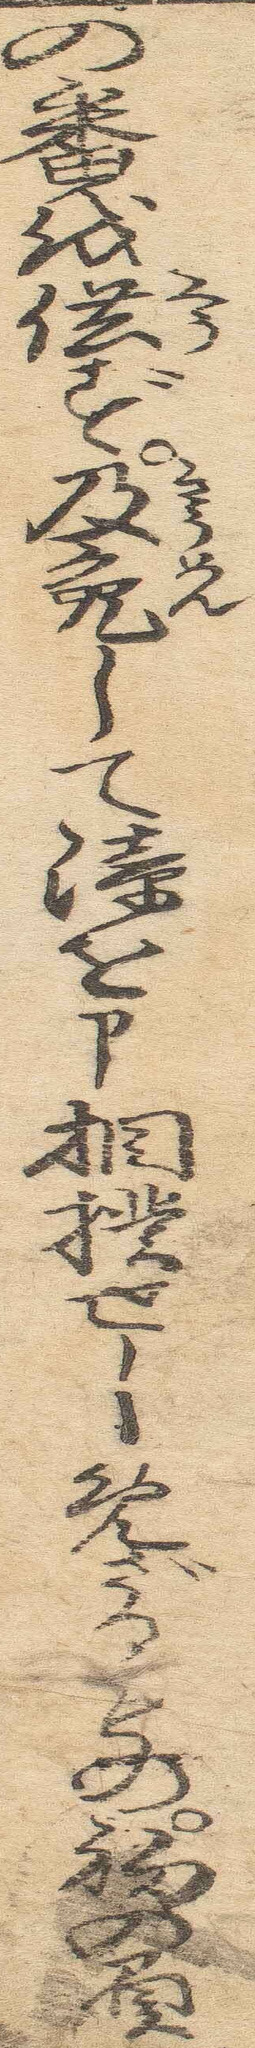の番を供ず。及免して障を申相撲せしめざるもの。初の負
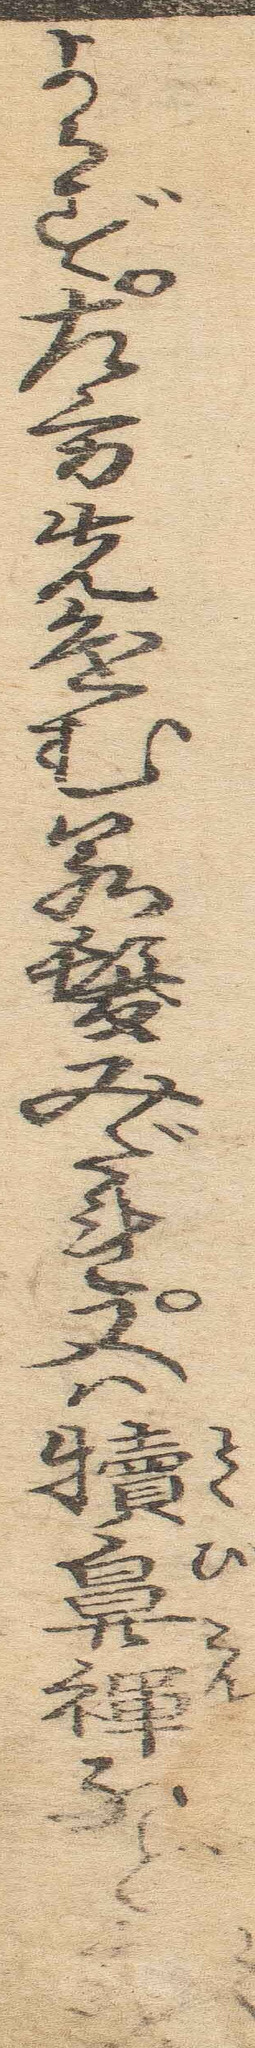よらず。左方先進む若髪みだれ。又は犢鼻褌など解る時
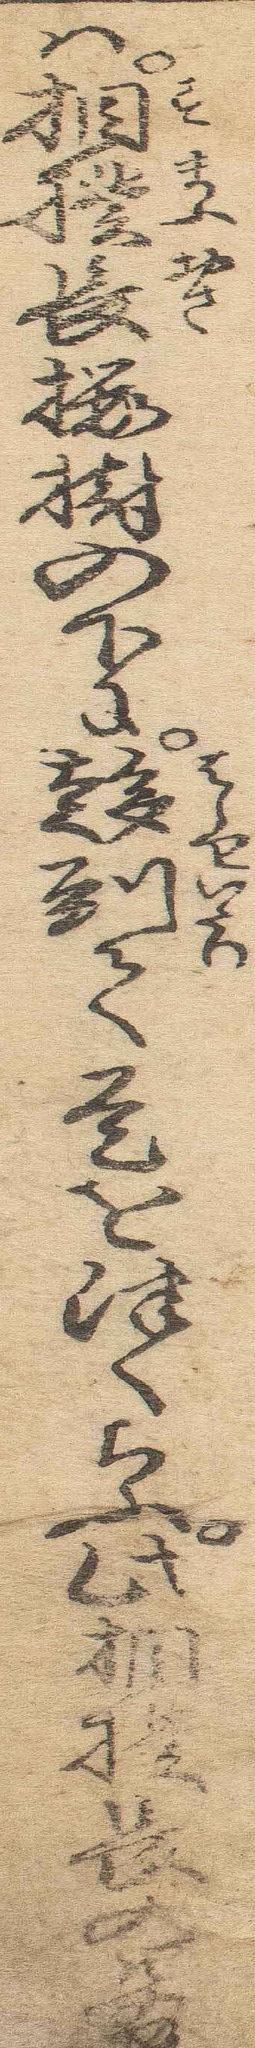は。相撲長桜樹の下に。趍到て是をつくらう。此相撲長の号
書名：古今相撲大全
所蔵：東京学芸大学附属図書館 国文学研究資料館
